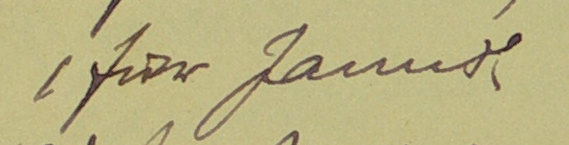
1 für Janusi.
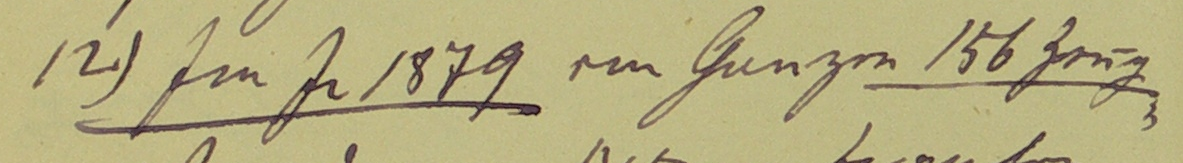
12 ) Im Jahre 1879 im Ganzen 156 Zeug¬
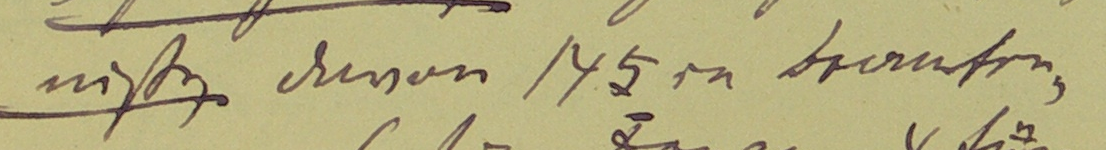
niße davon 145 in Beamten¬
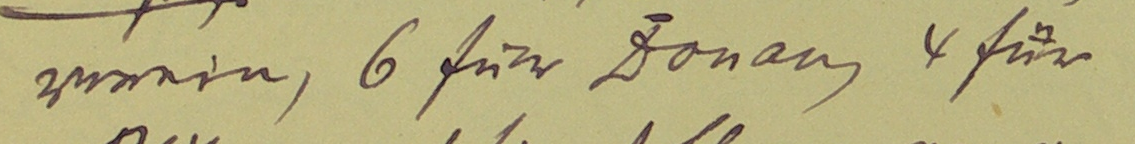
verein, 6 für Donau, 4 für
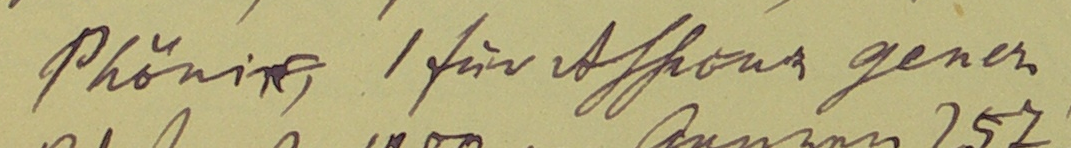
Phönix, 1 für Assicur. Generali.
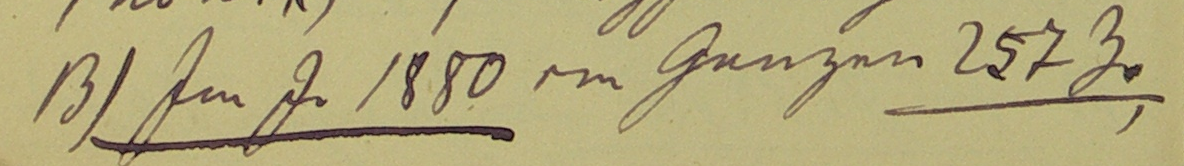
13) Im Jahre 1880 im Ganzen 257 Zeugniße
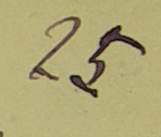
25
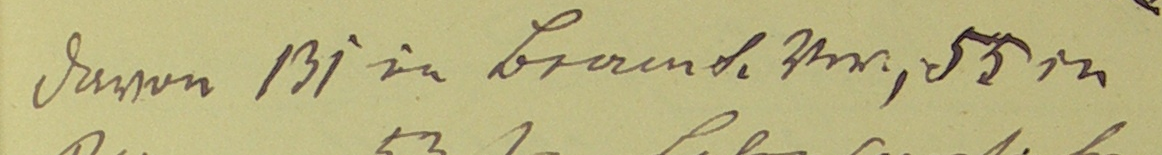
davon 131 in Beamtenverein, 55 in
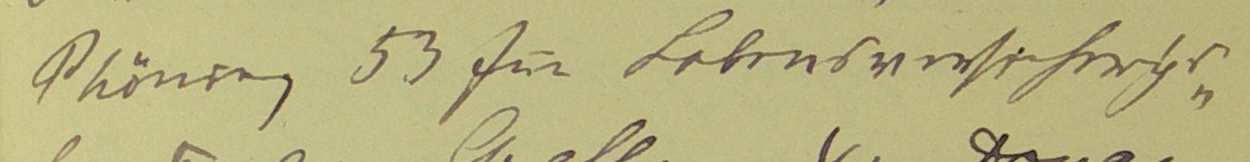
Phönix, 53 für Lebensversicherungs¬
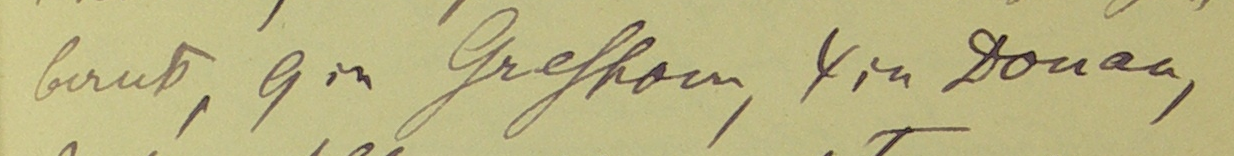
bank, 9 für Hestony, 4 für Donau,
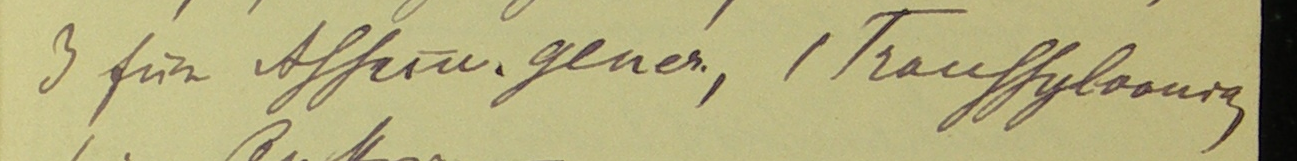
3 für Assicuracione generali, 1 für Transilvania,
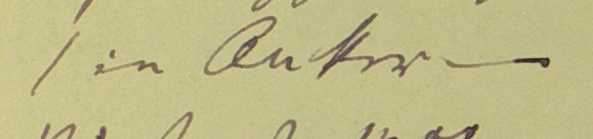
1 für Anker.
